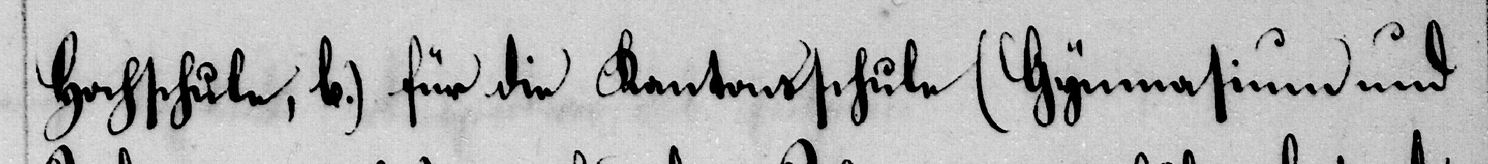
Hochschule, b.) für die Kantonsschule (Gymnasium und
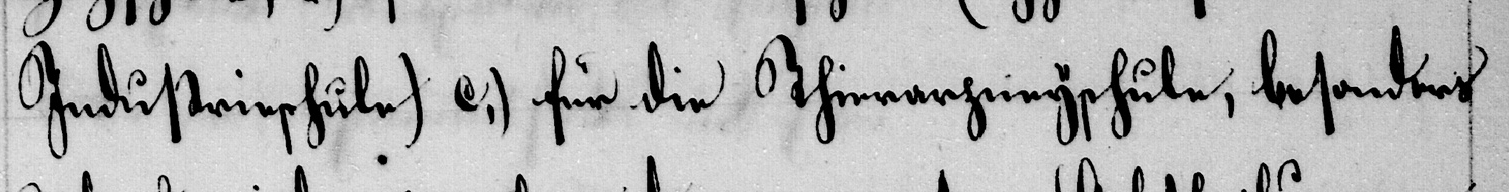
Industrieschule) c,) für die Thierarzneyschule, besonders
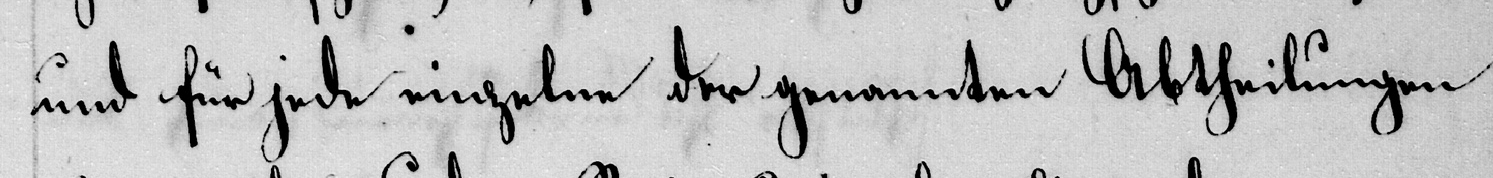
und für jede einzelne der genannten Abtheilungen
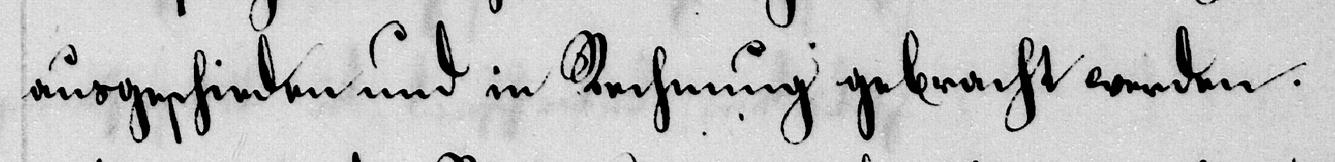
ausgeschieden und in Rechnung gebracht werden.
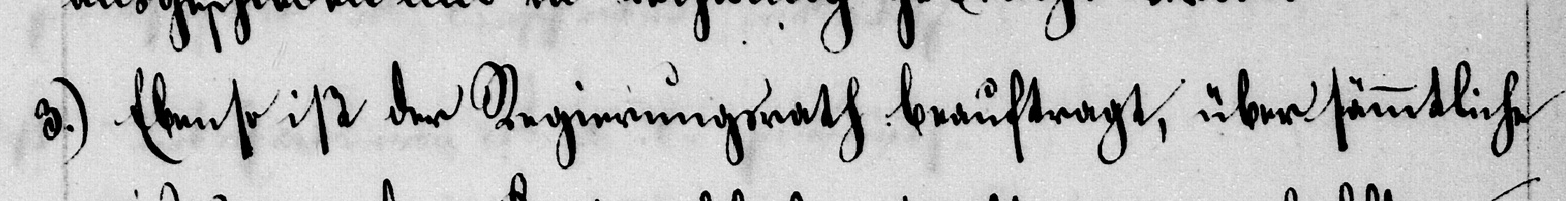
3.) Ebenso ist der Regierungsrath beauftragt, über sämmtliche
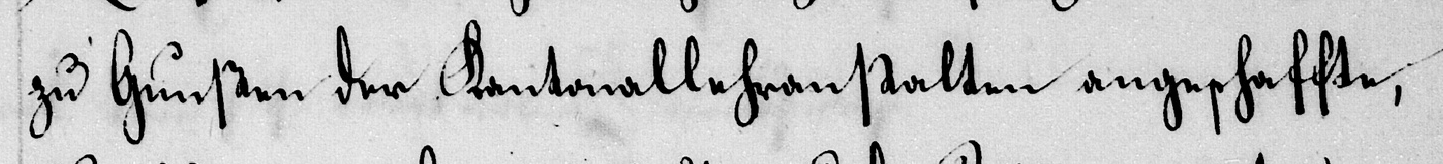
zu Gunsten der Kantonallehranstalten angeschafften,
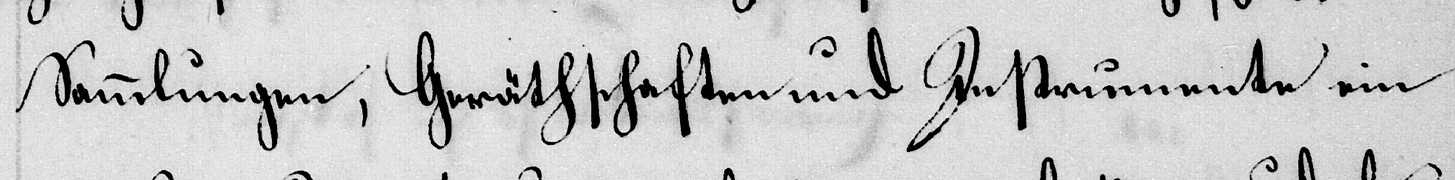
Sammlungen, Geräthschaften und Instrumente ein
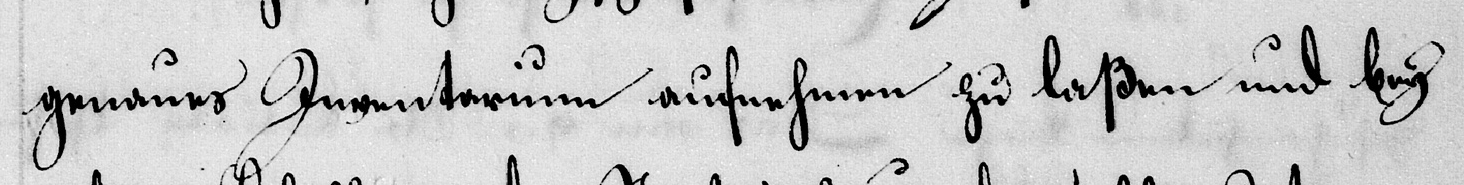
genaues Inventarium aufnehmen zu laßen und bey
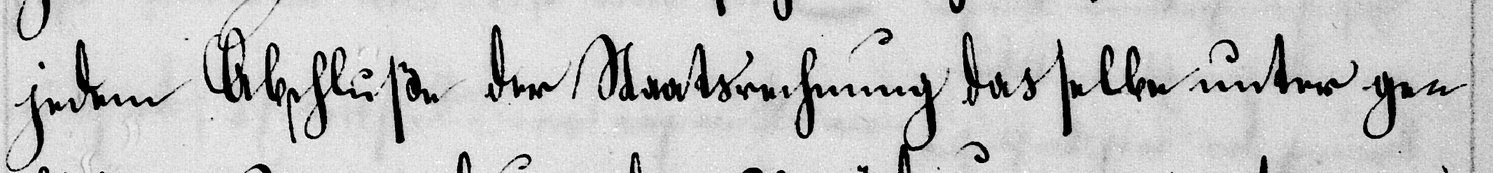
jedem Abschluße der Staatsrechnung dasselbe unter ge¬
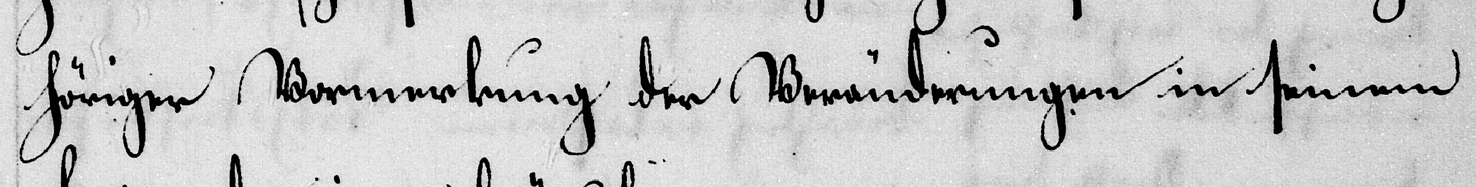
höriger Vormerkung der Veränderungen in seinem
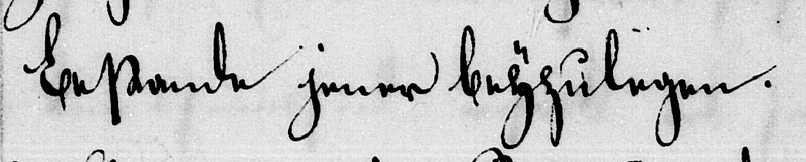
Bestande jener beyzulegen.
